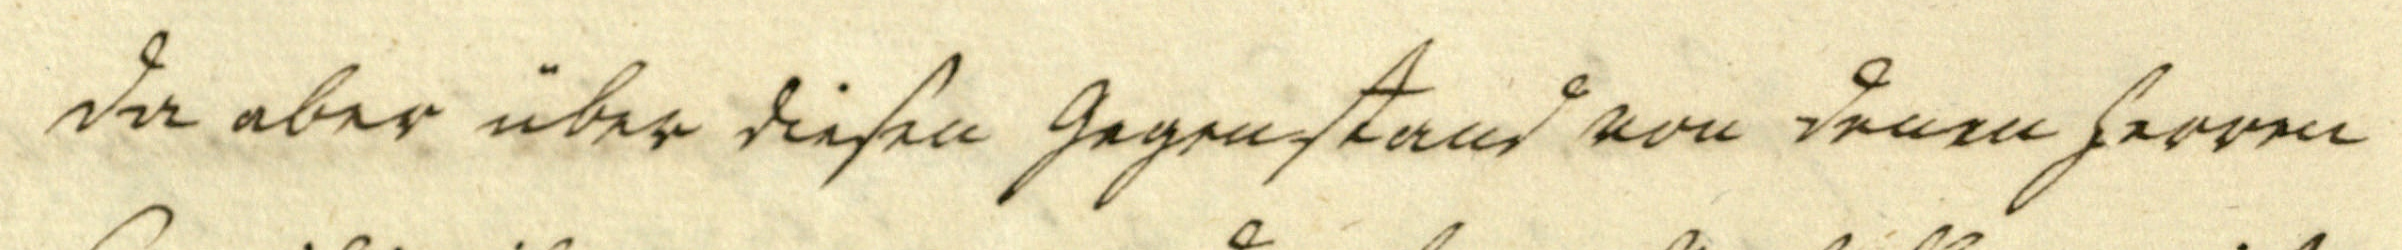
da aber über diesen Gegenstand von denen Herren
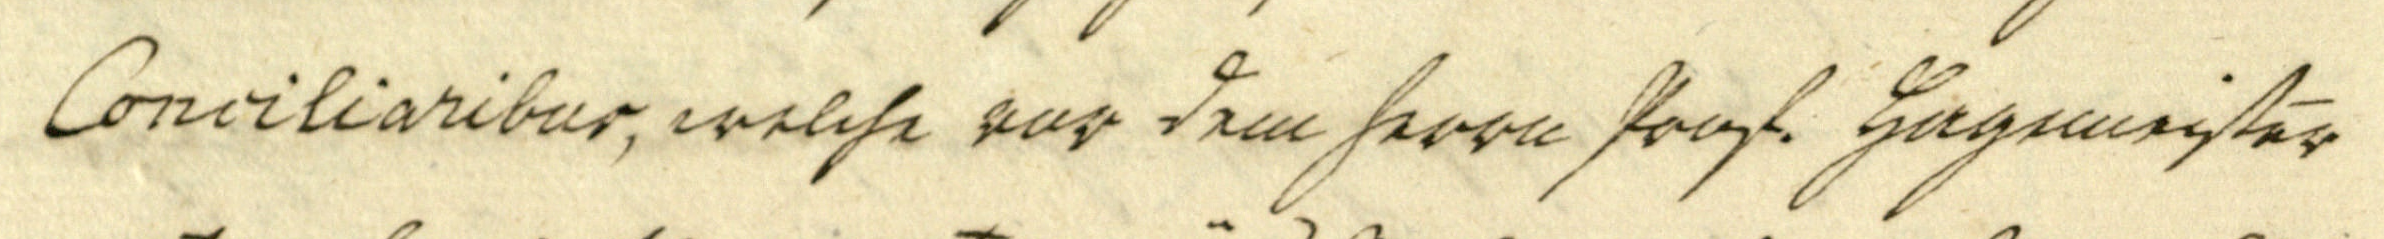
Conciliaribus, welche vor dem Herrn Prof. Hagemeister
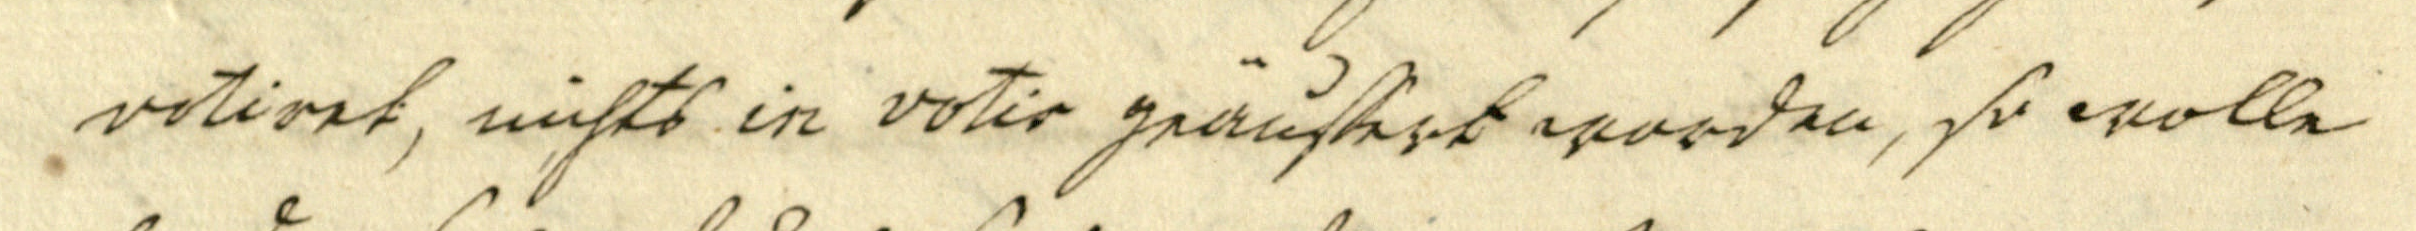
votiret, nichts in votis geäussert worden, so wolle
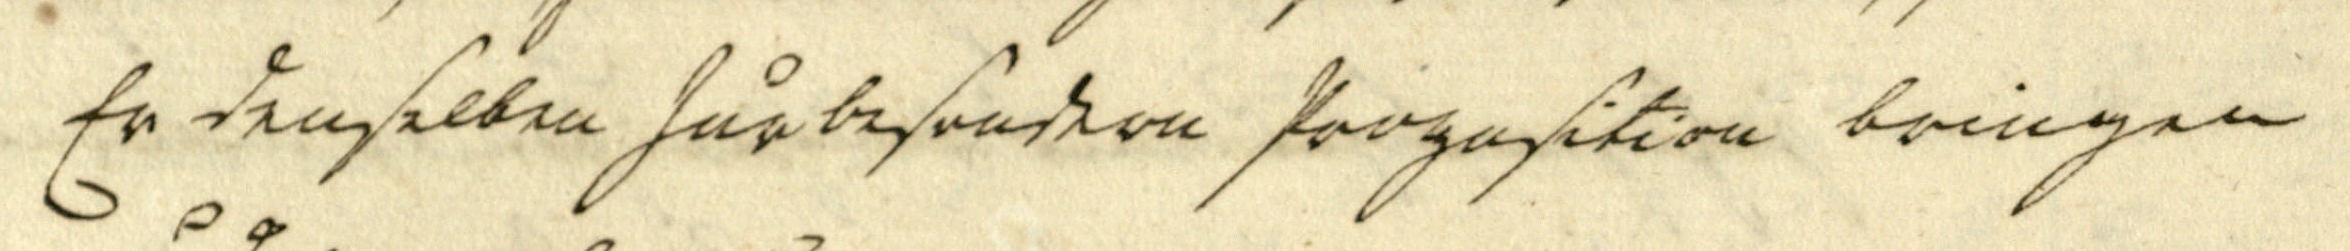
Er denselben zur besondern Proposition bringen
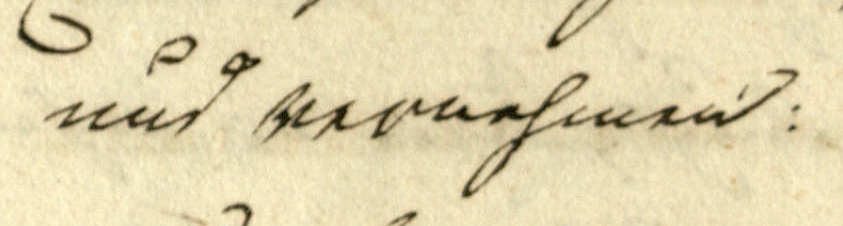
und vernehmen:
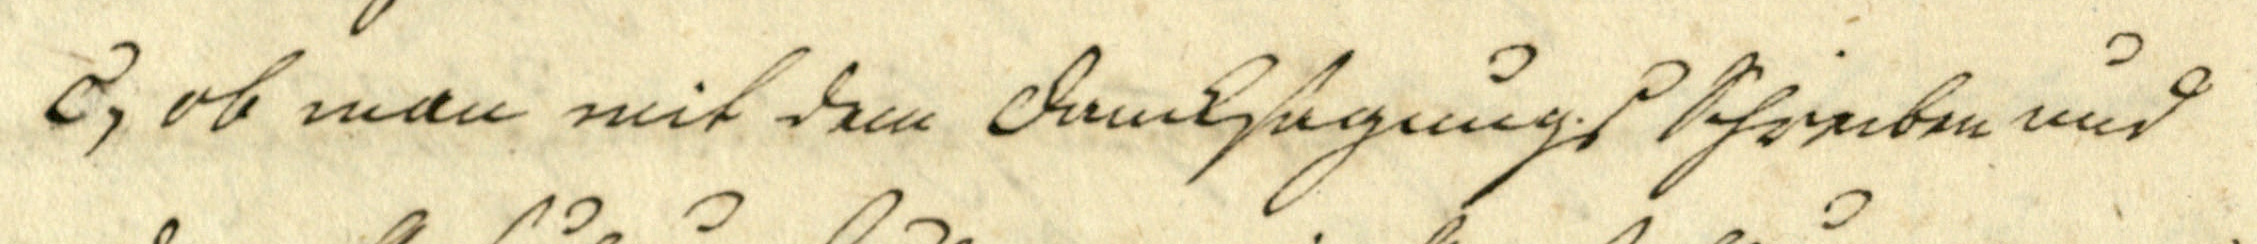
c, ob man mit dem Dancksagungs Schreiben und
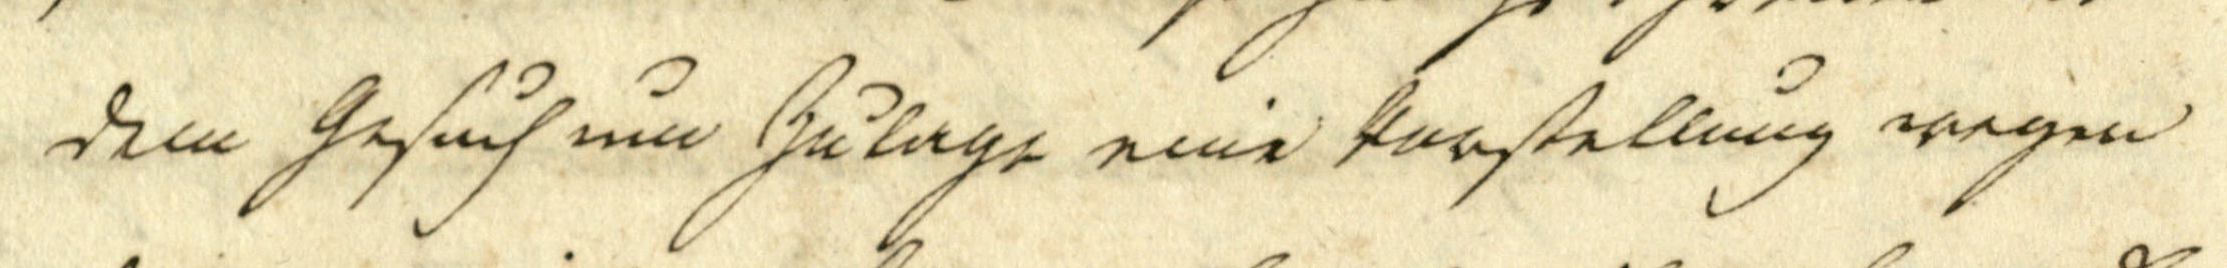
dem Gesuch um Zulage eine Vorstellung wegen
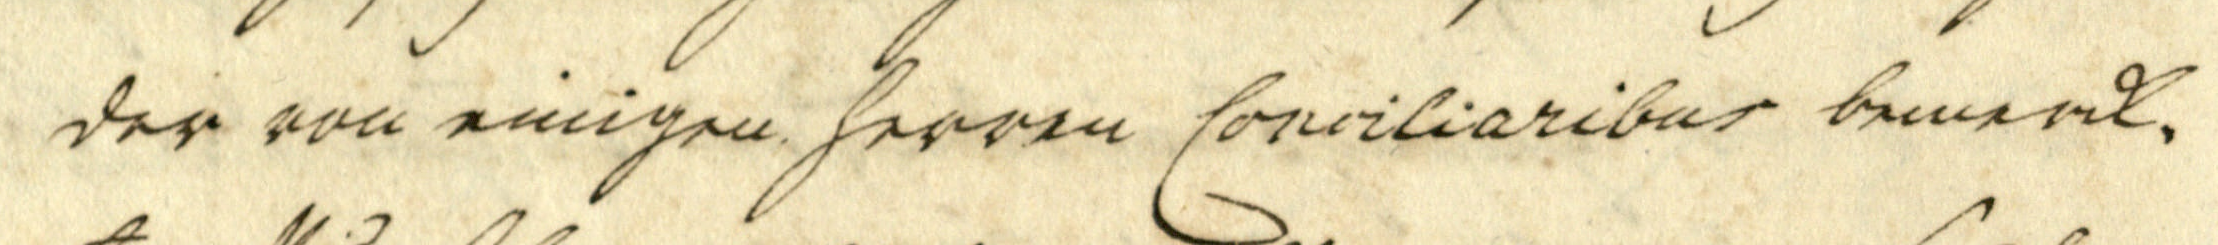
der von einigen Herren Conciliaribus bemerck¬
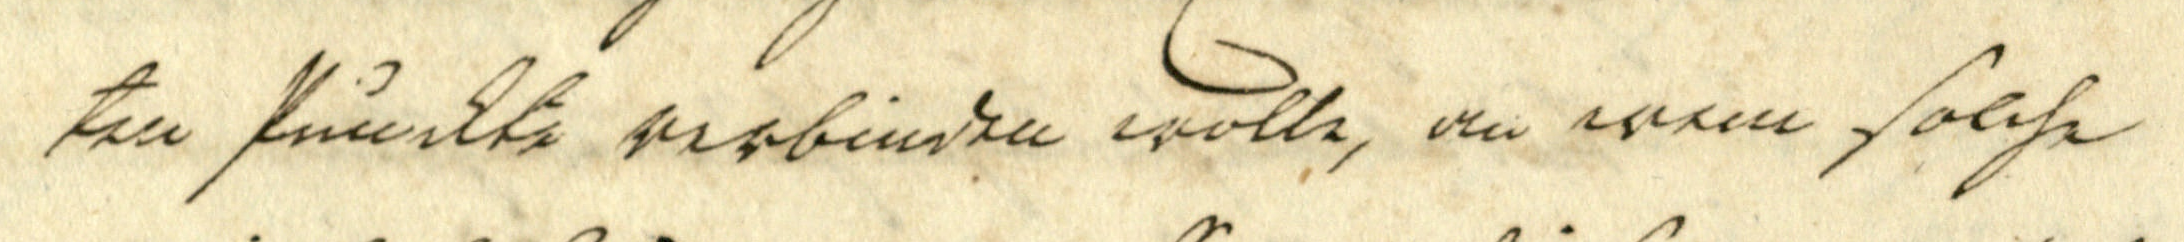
ten Punckte verbinden wolle, an wem solche
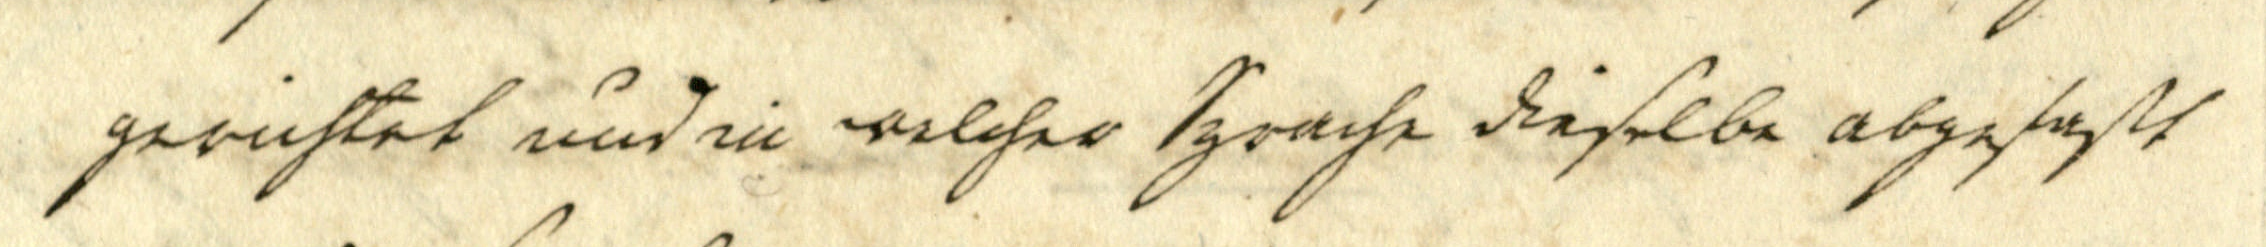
gerichtet und in welcher Sprache dieselbe abgefaßt
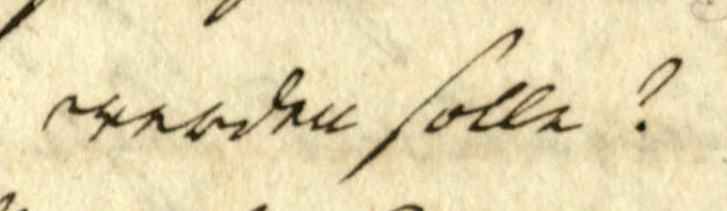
werden solle?
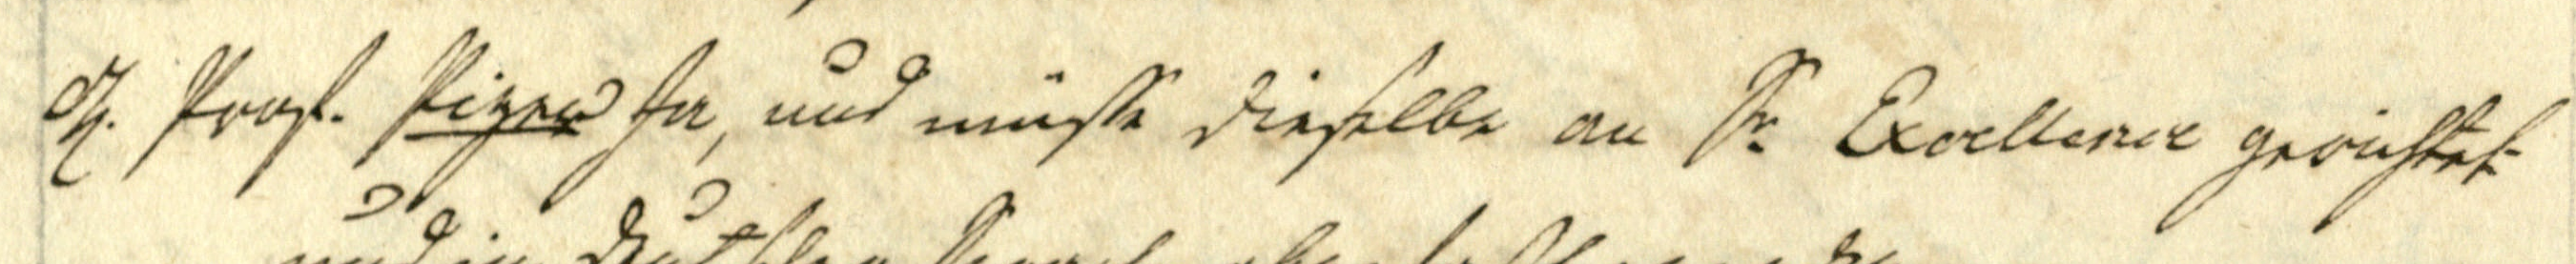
dh. Prof. Piper Ja, und müsse dieselbe an Sr Excellence gerichtet
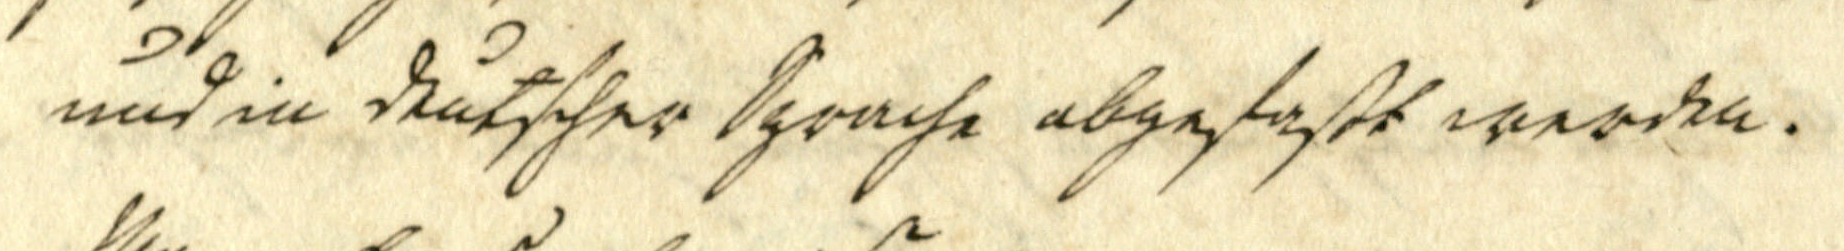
und in deutscher Sprache abgefaßt werden.
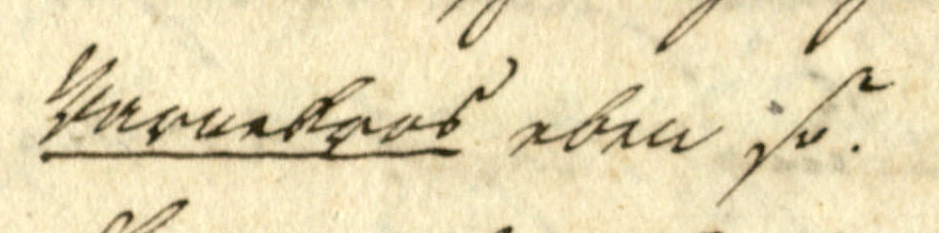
Warnekros eben so.
